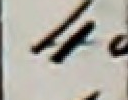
4
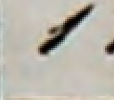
1
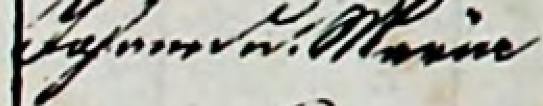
Johann u. Maria
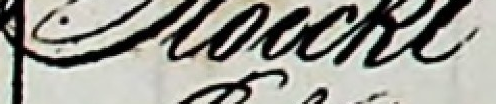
Stoeckl
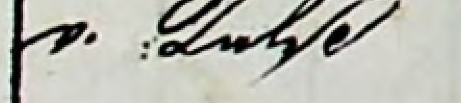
v. Kalß
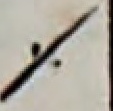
./.
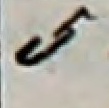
5
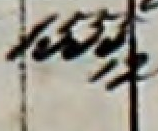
1555,2
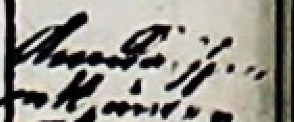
am ???
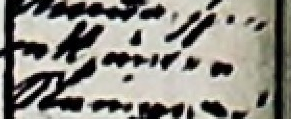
??? unter
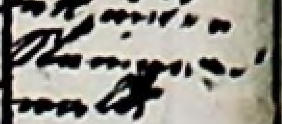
Stein???
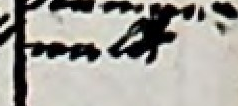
wald
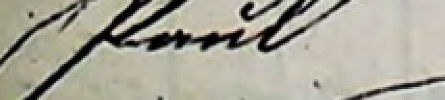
Paul
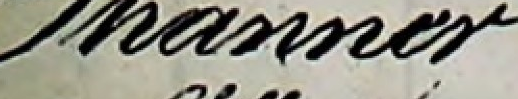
Thanner
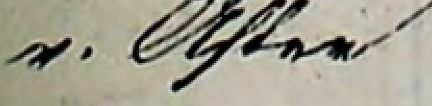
v. Aster
